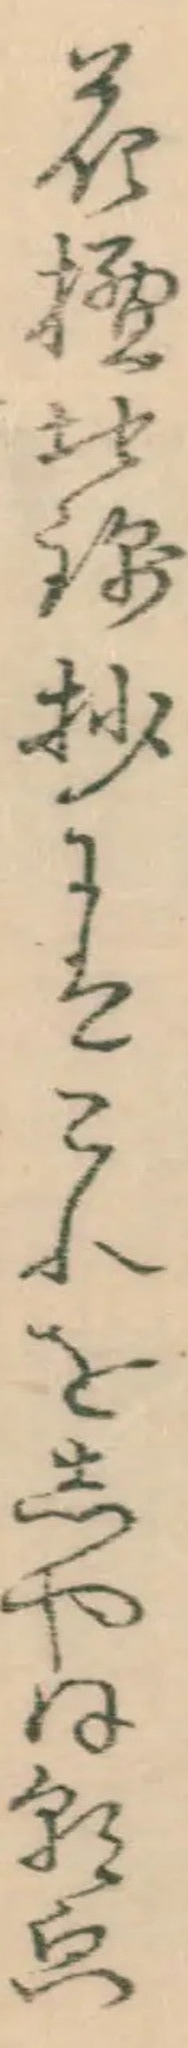花壇地錦抄にはこれをしやほ朝皃
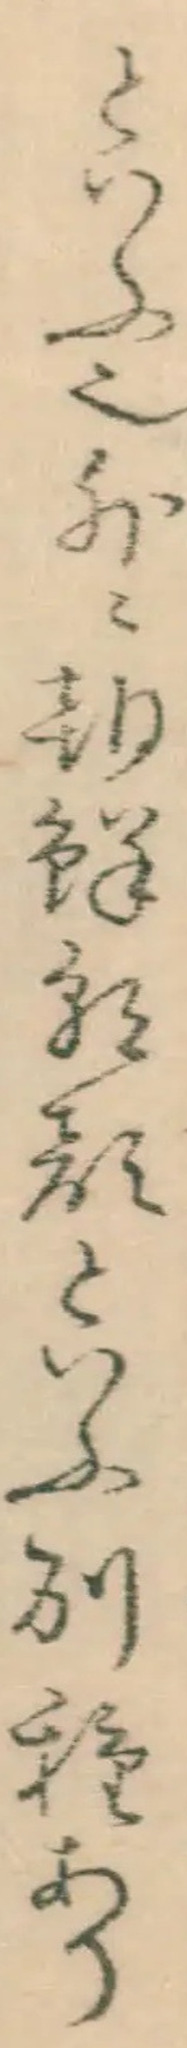といふ也外に朝鮮朝顔といふ別種あり
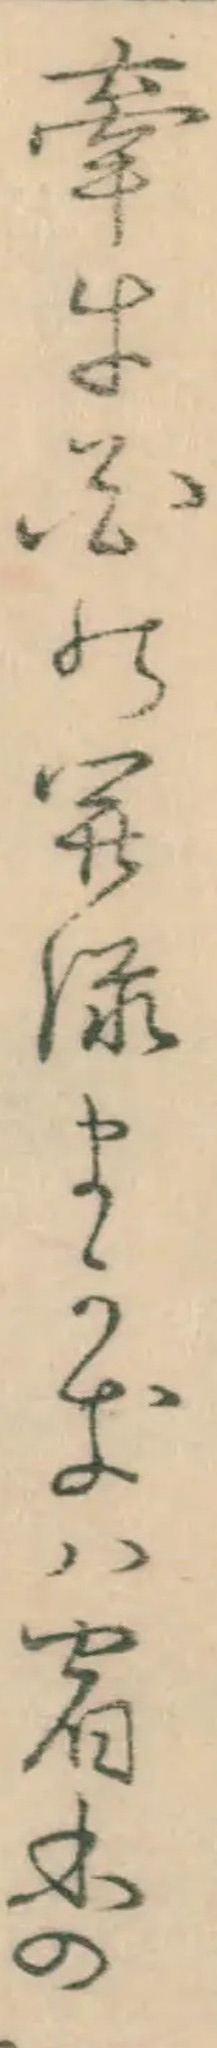牽牛花の開まかきは宿木の
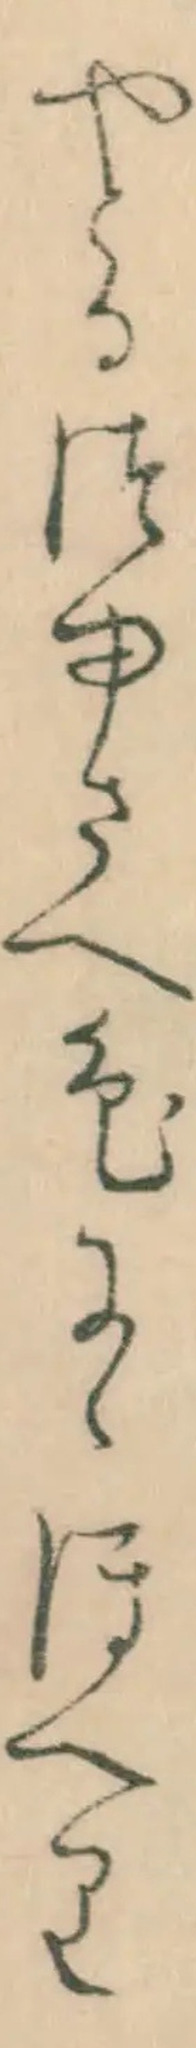やとるつゆさへ色ににほへり貞顕

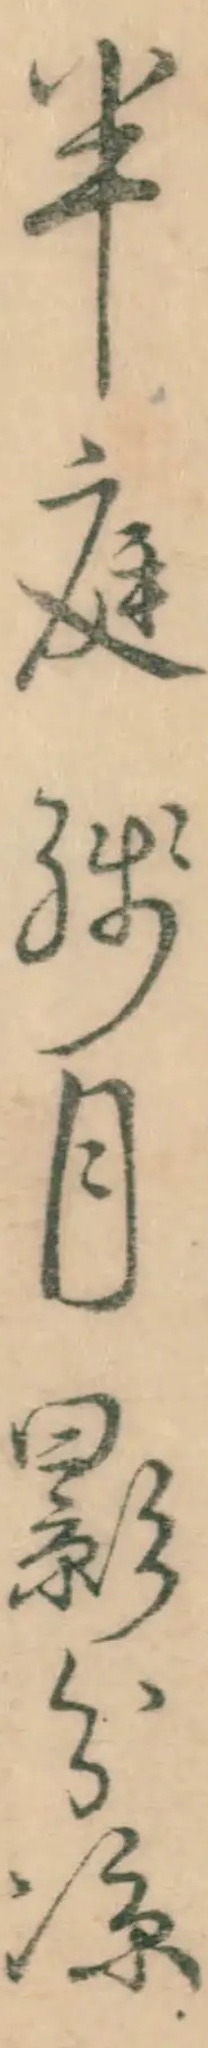半庭残月影分涼
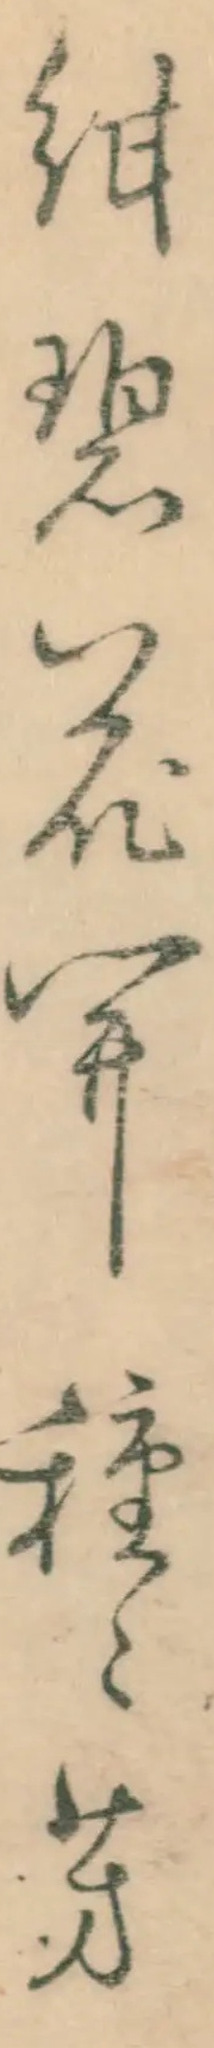紺碧花開種々芽
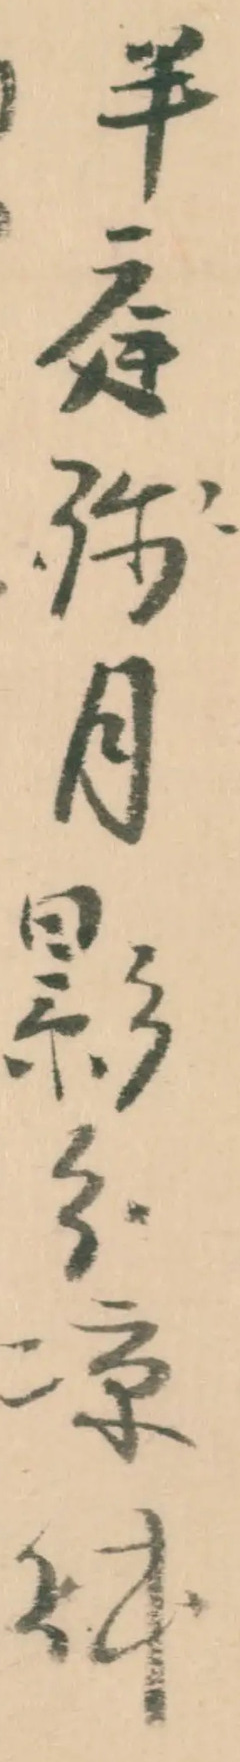半庭残月影分涼
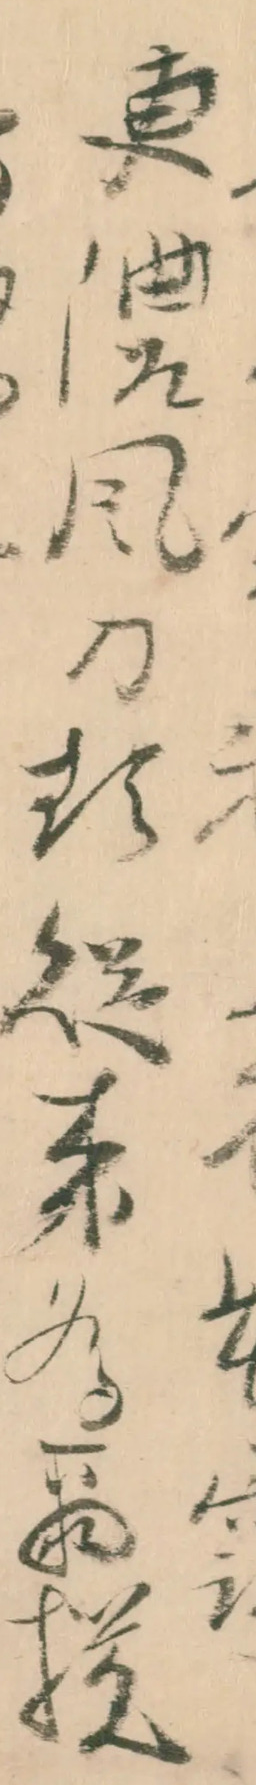更濃風刀類来為雨撹
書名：花壇朝顔通 2巻. [1]
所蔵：国立国会図書館 National Diet Library, JAPAN
